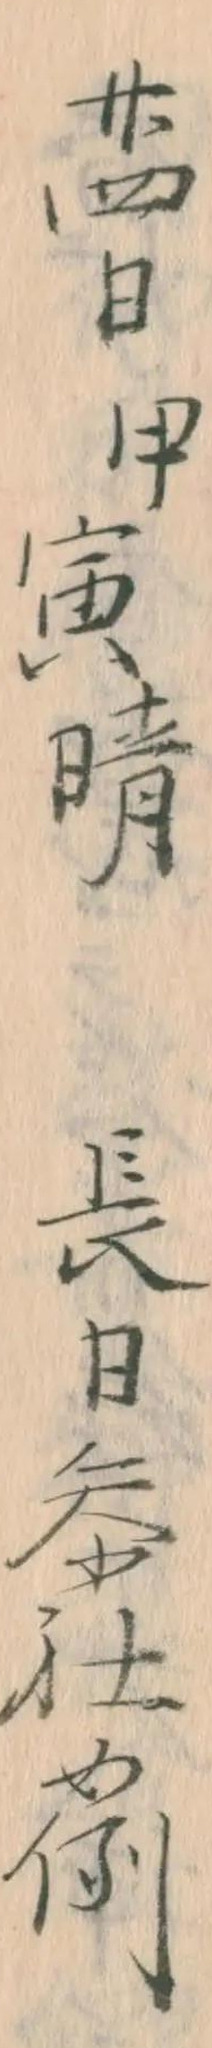廿四日甲寅晴長日参社如例
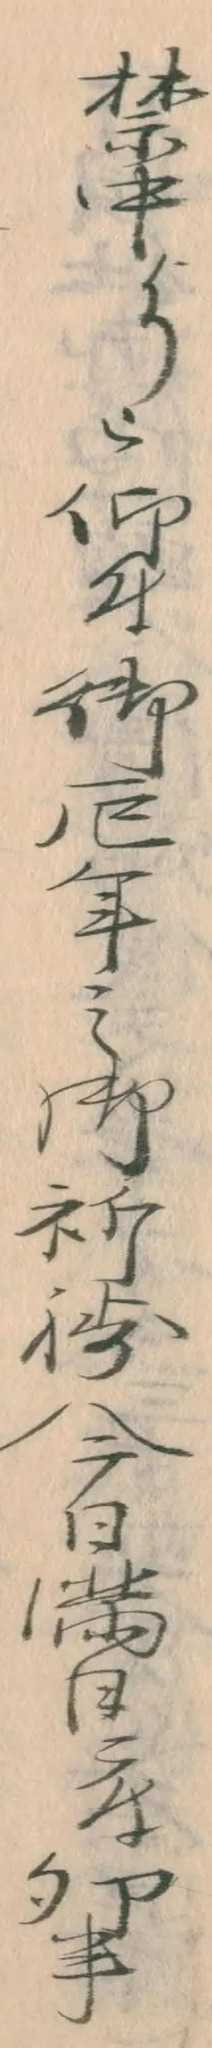一禁中より被仰付御厄年之御祈祷今日満目ニ付卯半
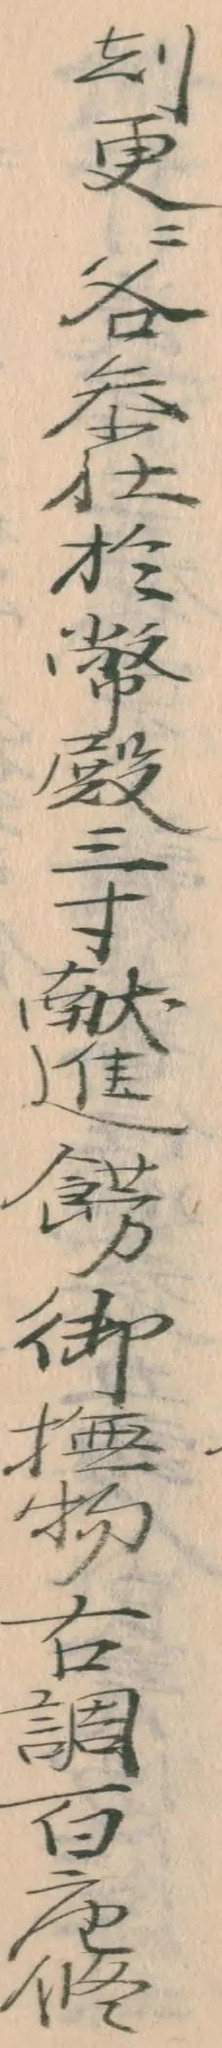刻更ニ各参社於幣殿三寸献進餝御撫物古調百座修
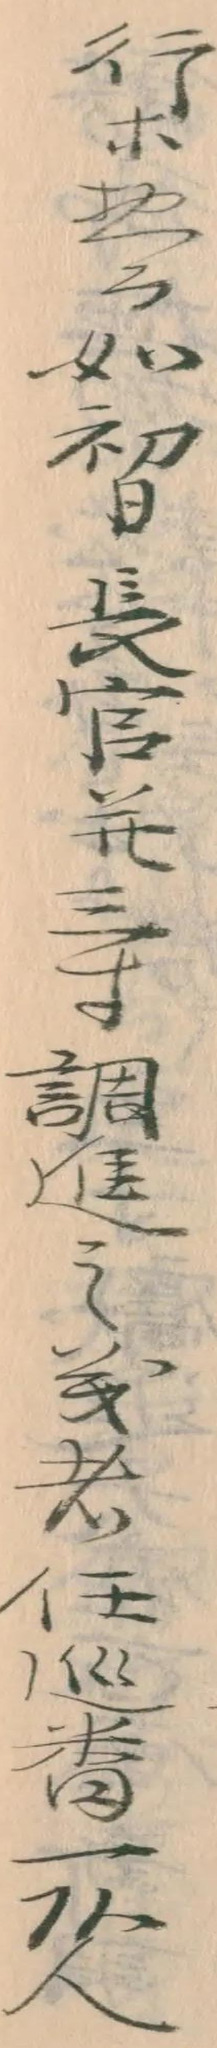行等惣而如初日長官并三寸調進之義者任巡番一頭人
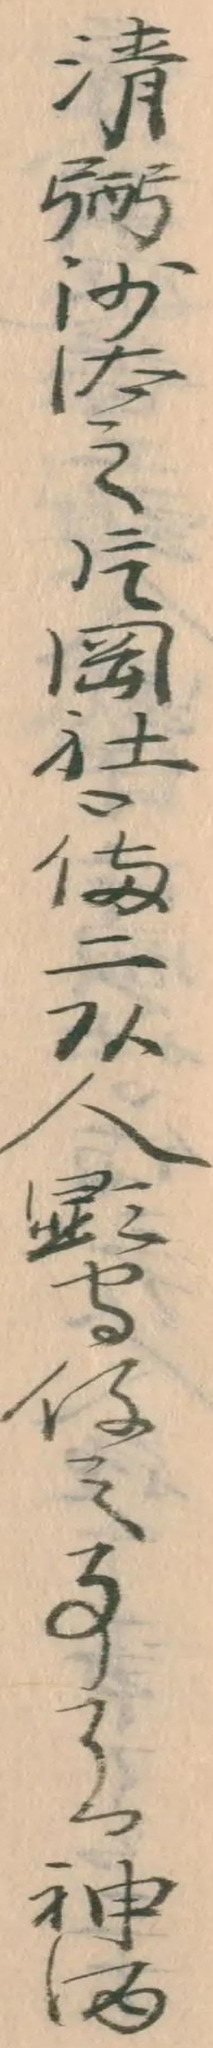清弼沙汰之片岡社御備二頭人顕守役之事了而神酒
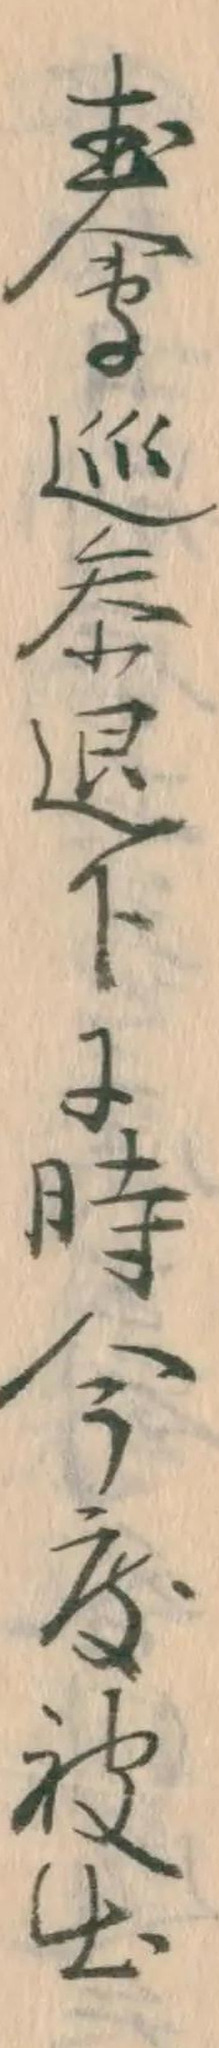直會巡参退下于時今度被出
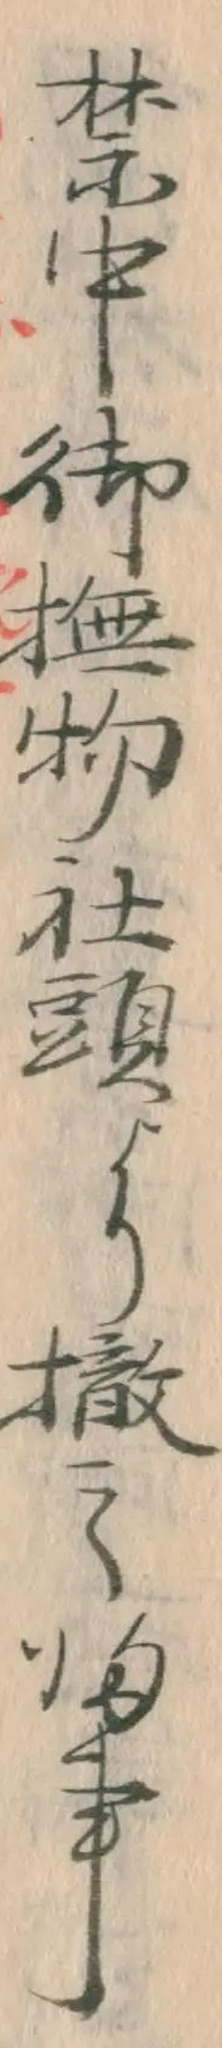禁中御撫物社頭より撒之帰事
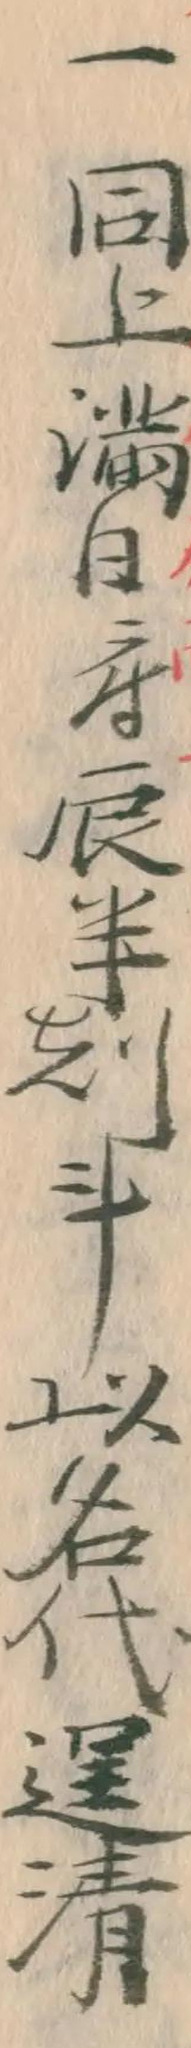一同上満日に付辰半刻斗以名代逞清
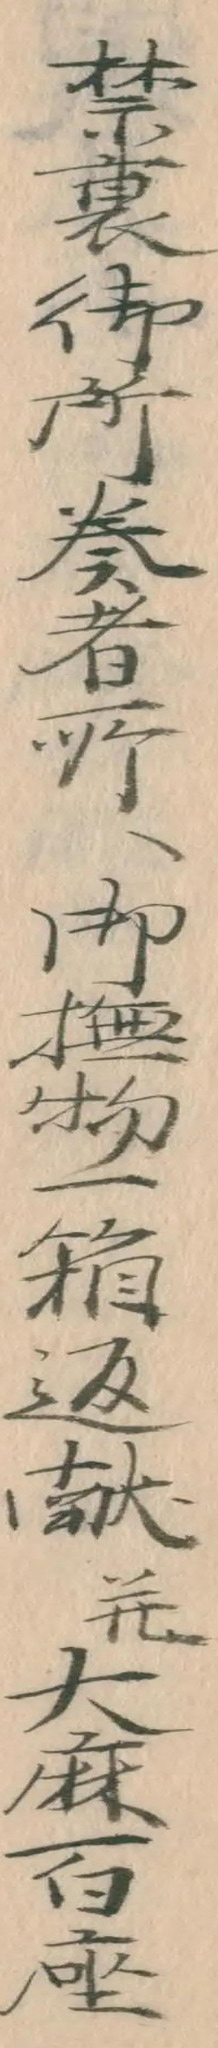禁裏御所奏者所へ御撫物一箱返献并大麻百座
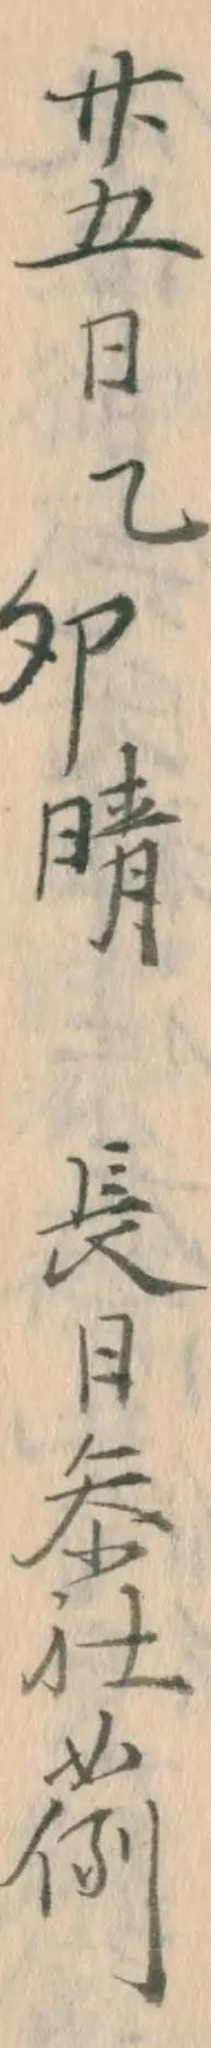廿五日乙卯晴長日参社如例
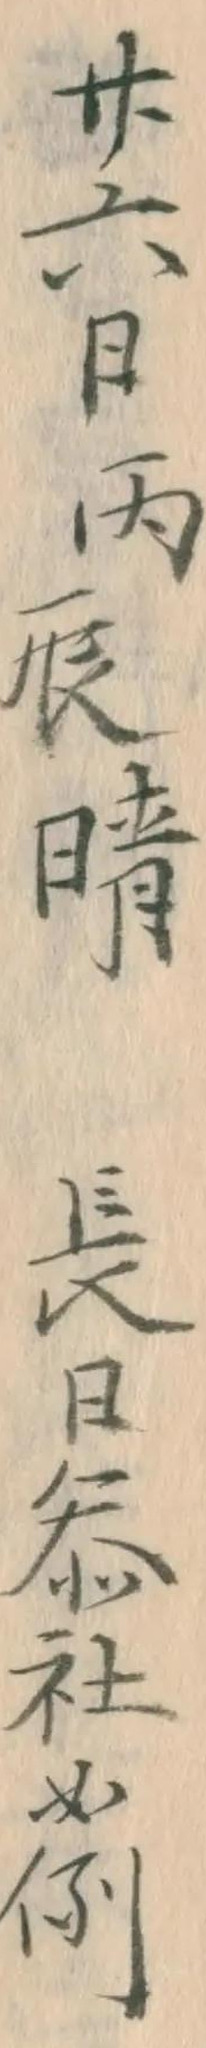廿六日丙巳晴長日参社如例
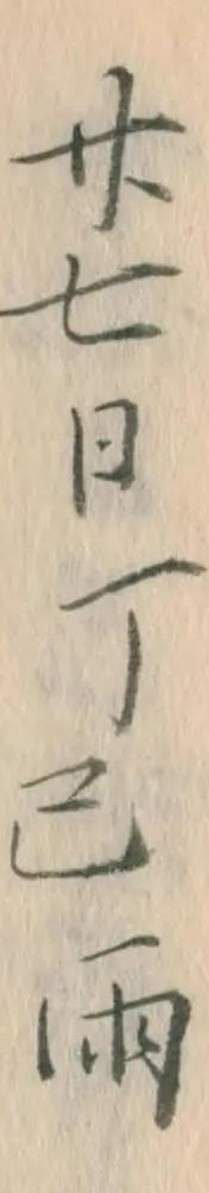廿七日丁巳雨

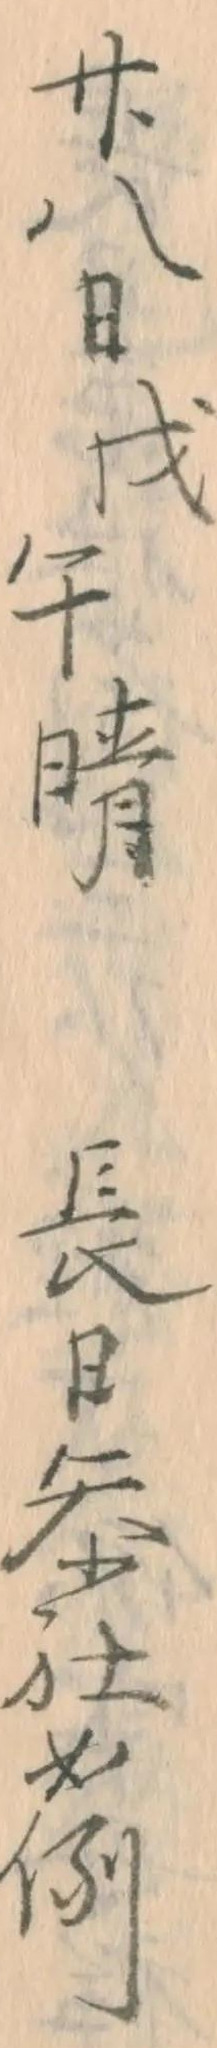廿八日戊午晴長日参社如例
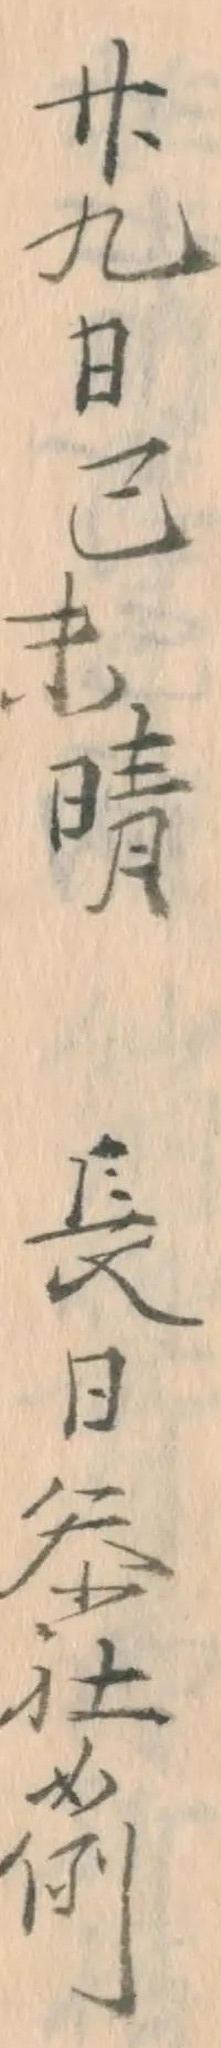廿九日己未晴長日参社如例
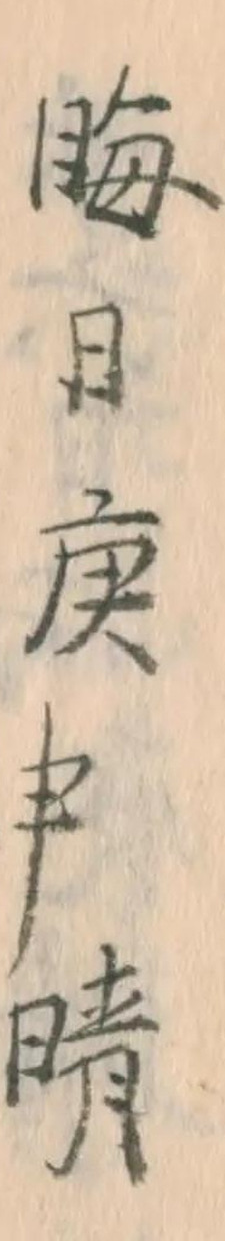晦日庚申晴
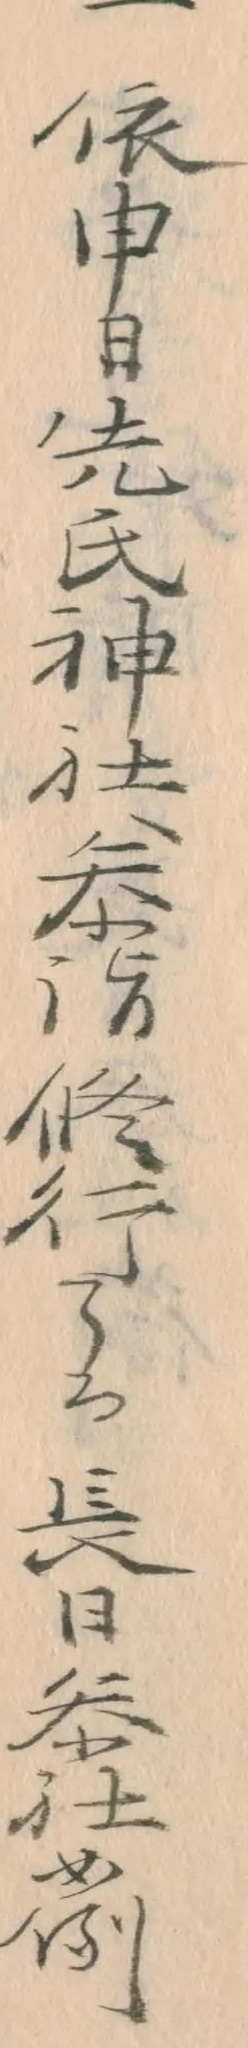一依申日先氏神社へ参詣修行了而長日参社如例
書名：賀茂社記録. 第73冊
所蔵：国立国会図書館 National Diet Library, JAPAN
